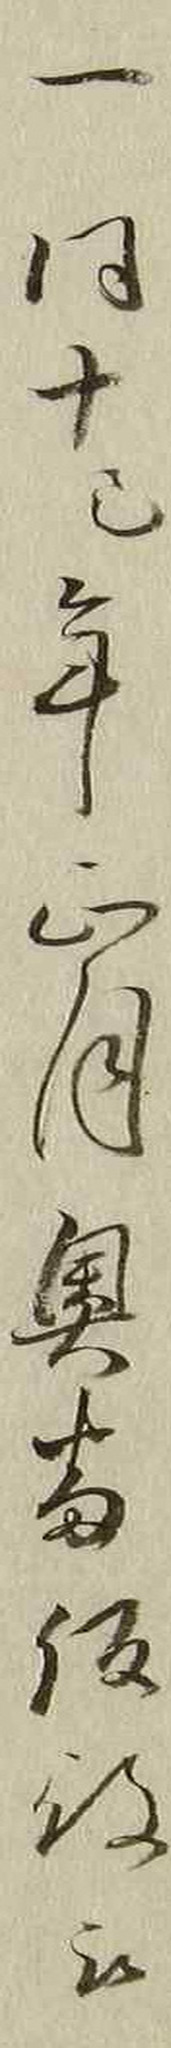一同十巳年正月奥番仮役被
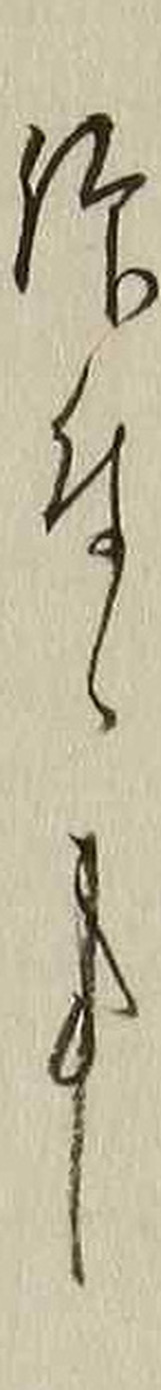仰付候事
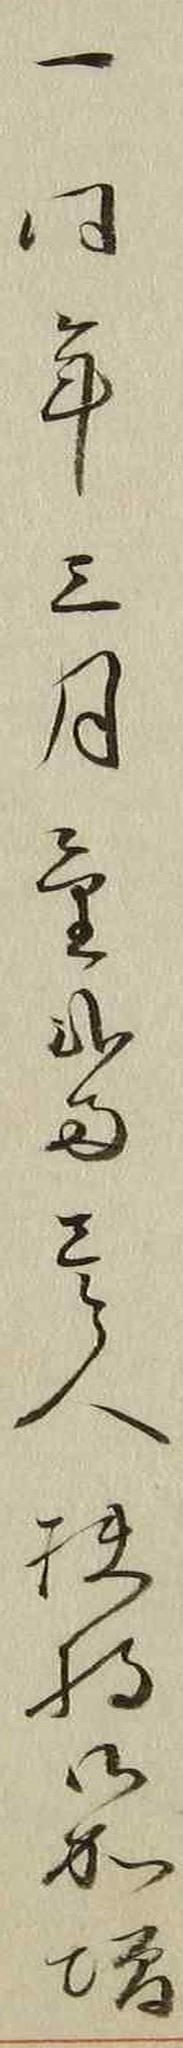一同年三月金弐両壱人扶持御加増
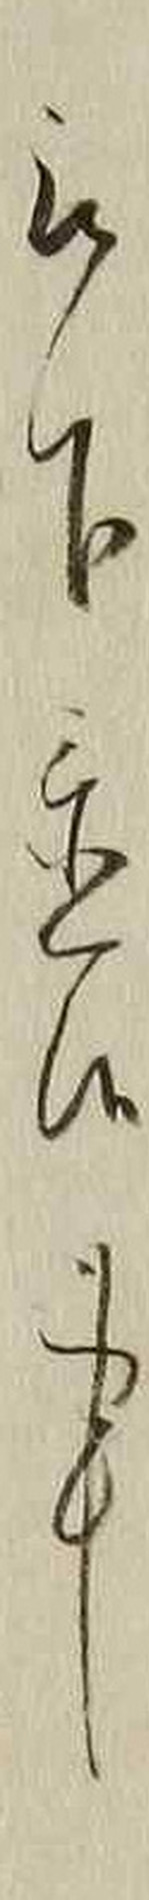被下置候事
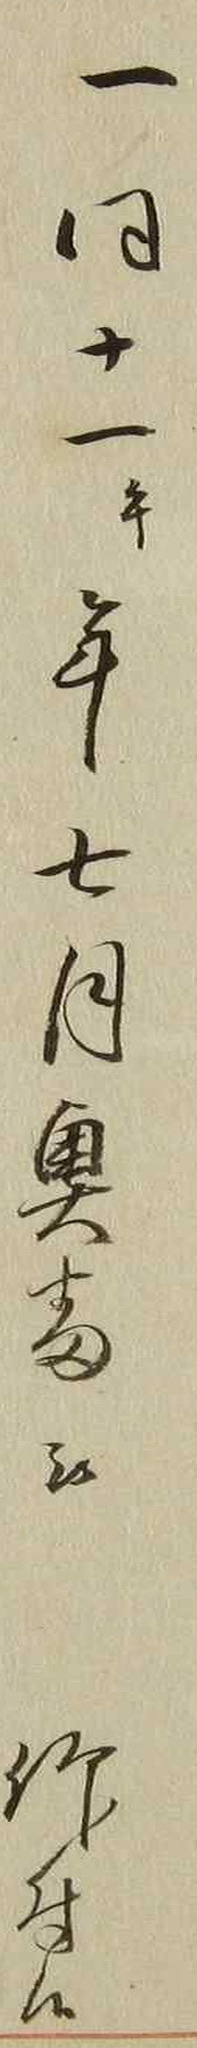一同十一午年七月奥番被仰付候
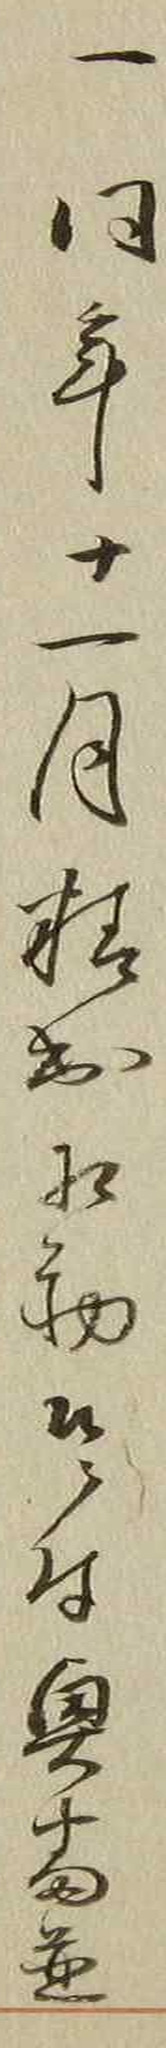一同年十一月精出相勤候ニ付奥番並
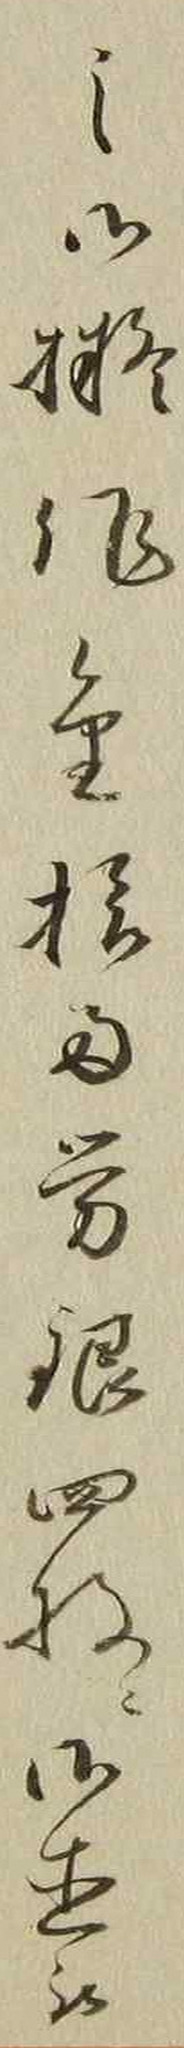之御擬作金拾両労銀四枚ニ御直被
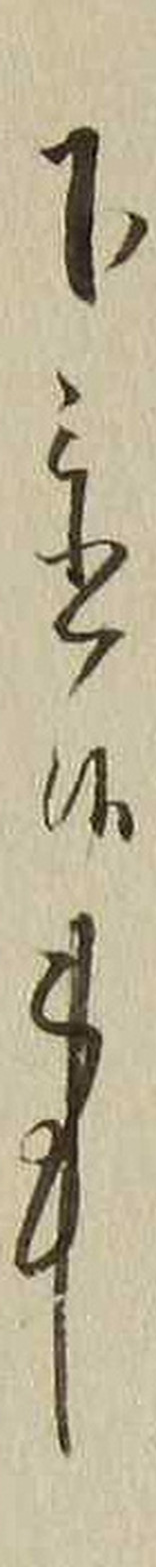下置候事
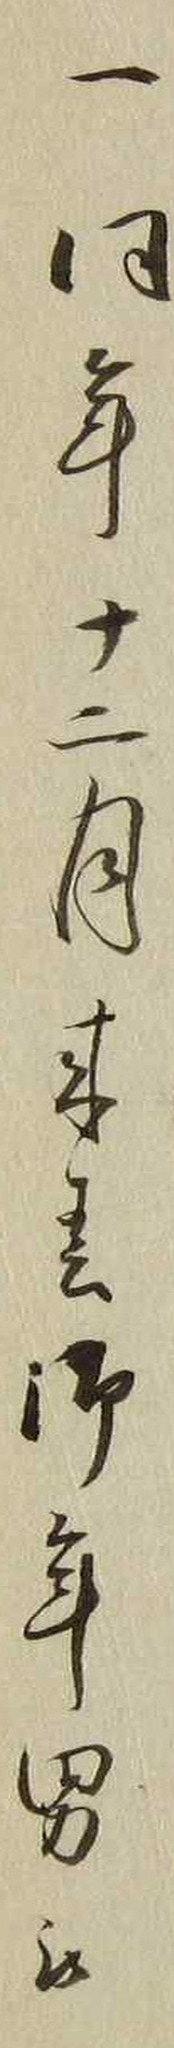一同年十二月来春御年男被
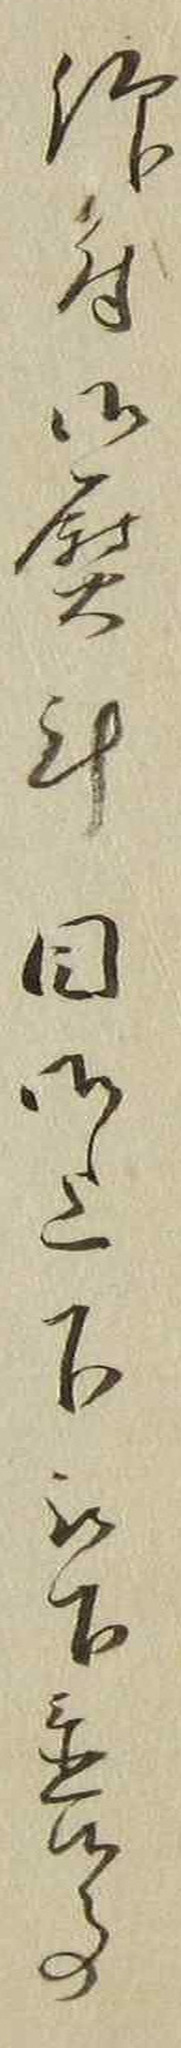仰付御熨斗目御上下被下置候事
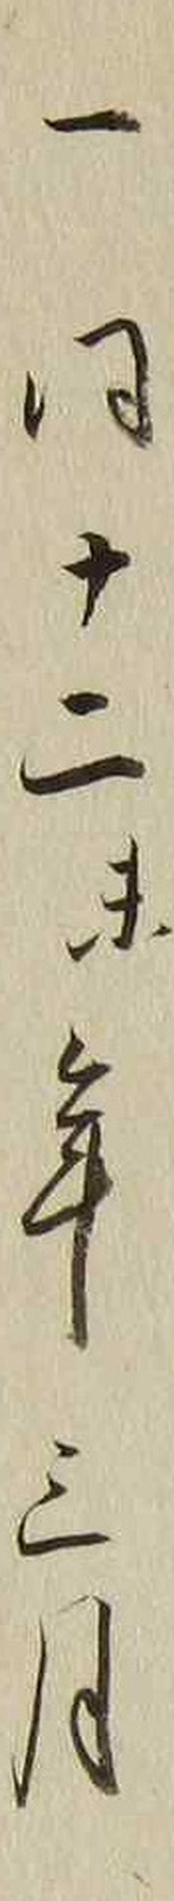一同十二未年三月
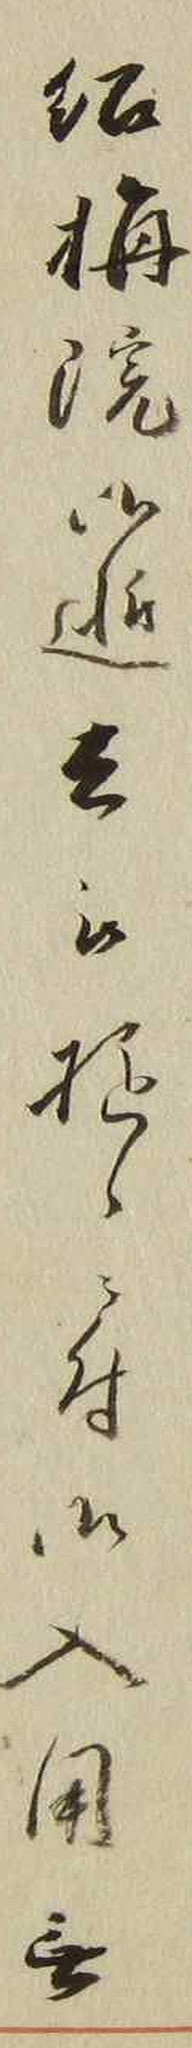紹栴院御逝去被遊候ニ付御入用無
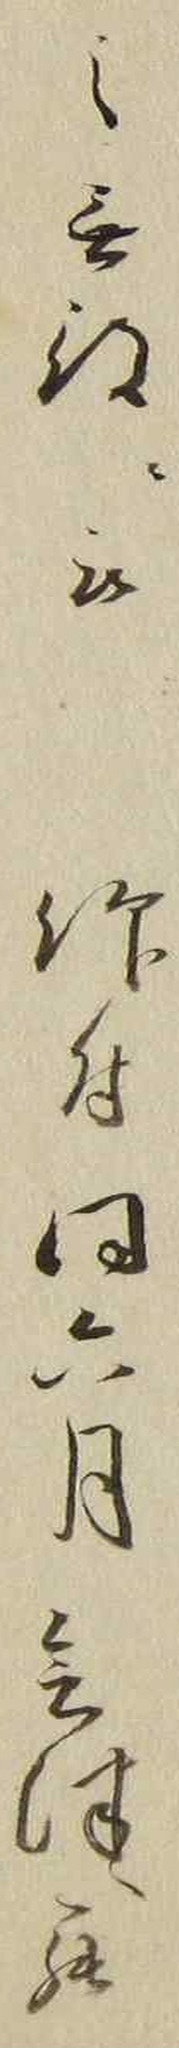之無役ニ被仰付同六月会津へ罷

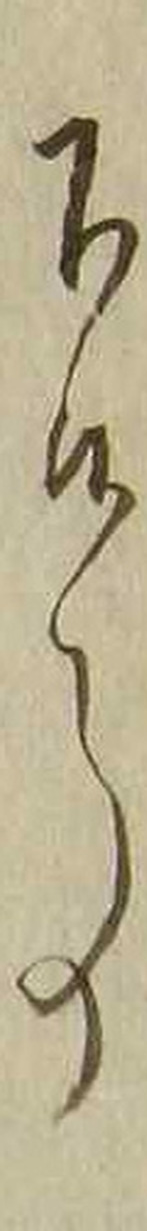下候事
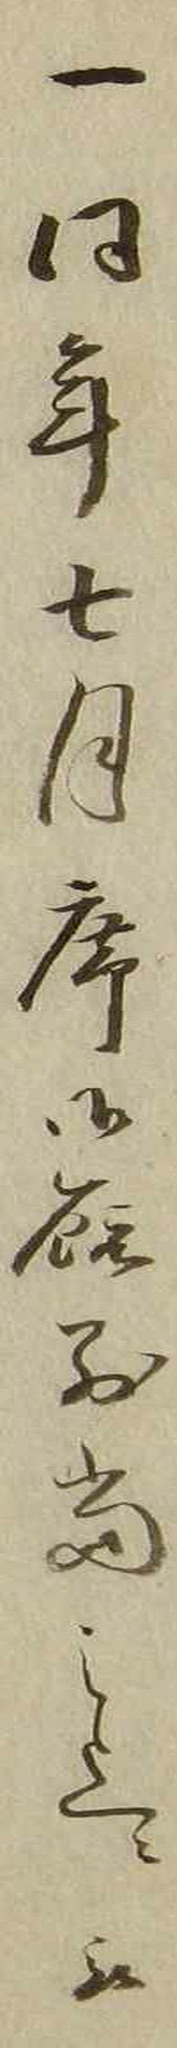一同年七月席御厩別当之上ニ被
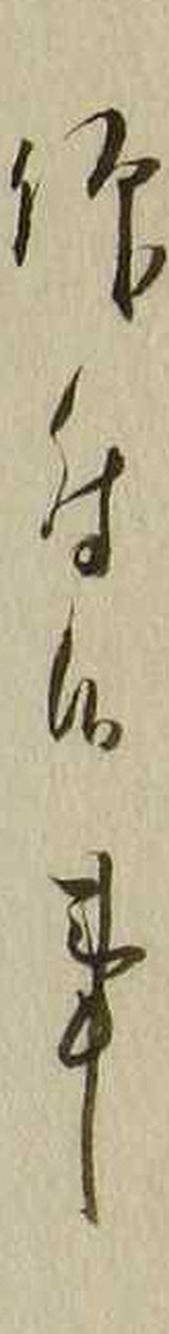仰付候事
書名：諸士系譜　巻之32　い之部32
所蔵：会津若松市立会津図書館
